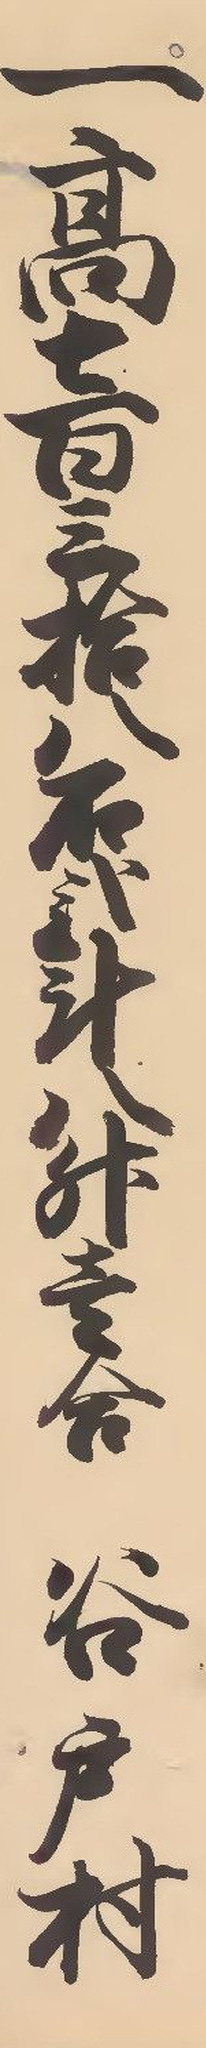一高七百三拾八石弐斗八升壱合谷戸村
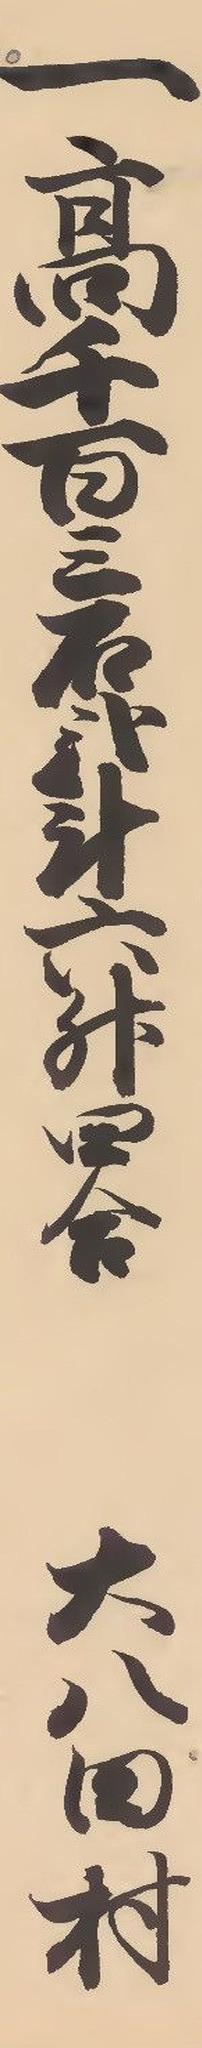一高千百三石弐斗六升四合大八田村
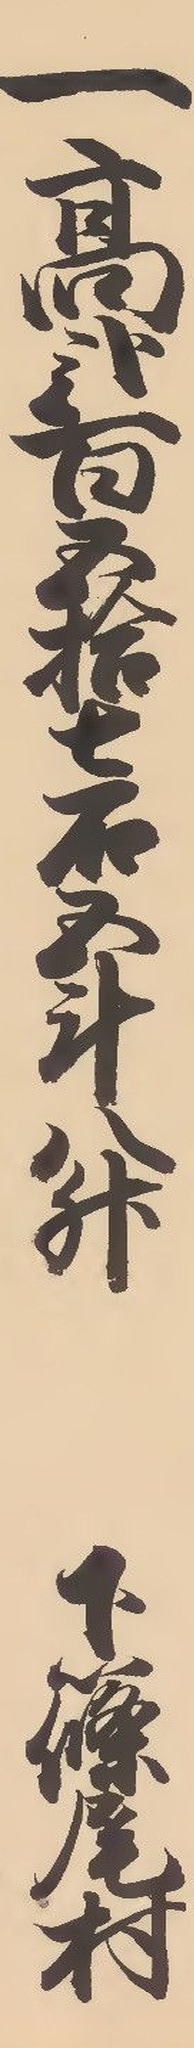一高弐百五拾七石五斗八升下条尾村
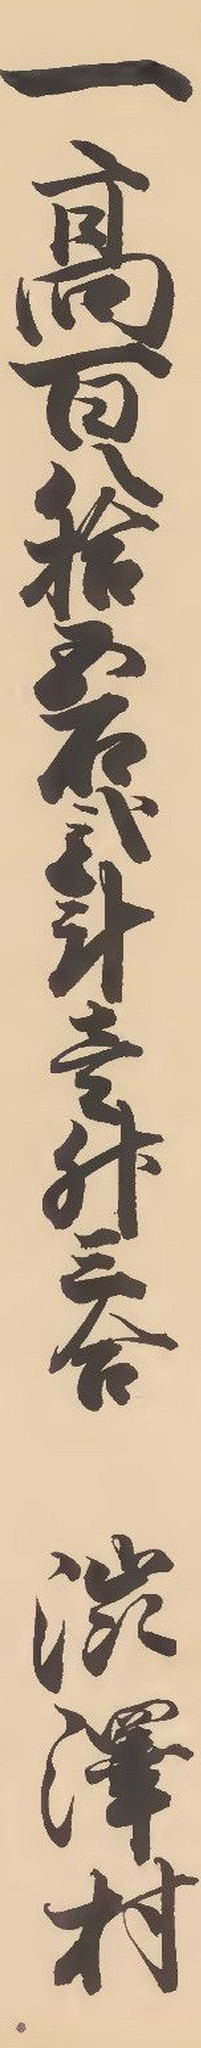一高百八拾五石弐斗壱升三合渋沢村
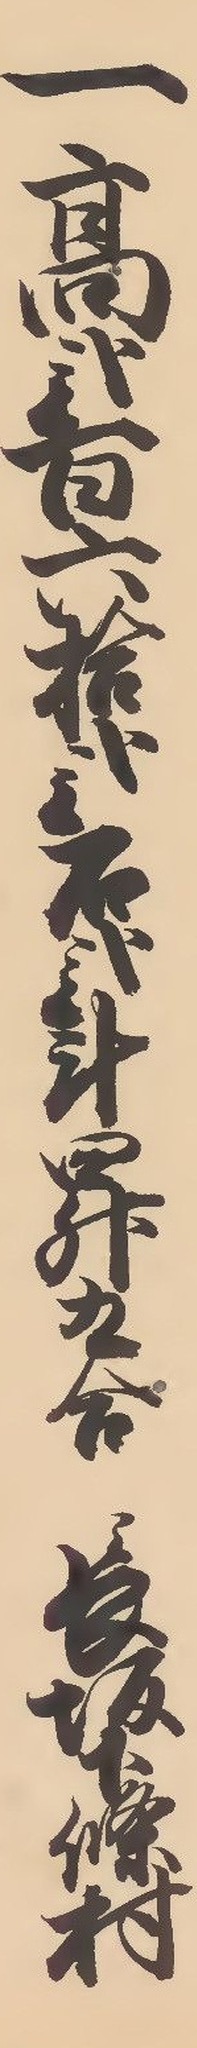一高弐百六拾弐石弐斗四升九合長坂下条村

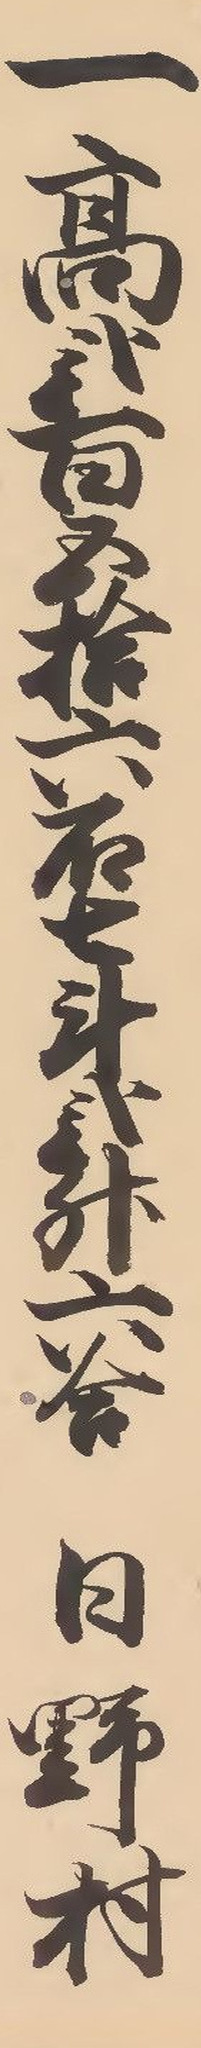一高弐百五拾六石七斗弐升六合日野村
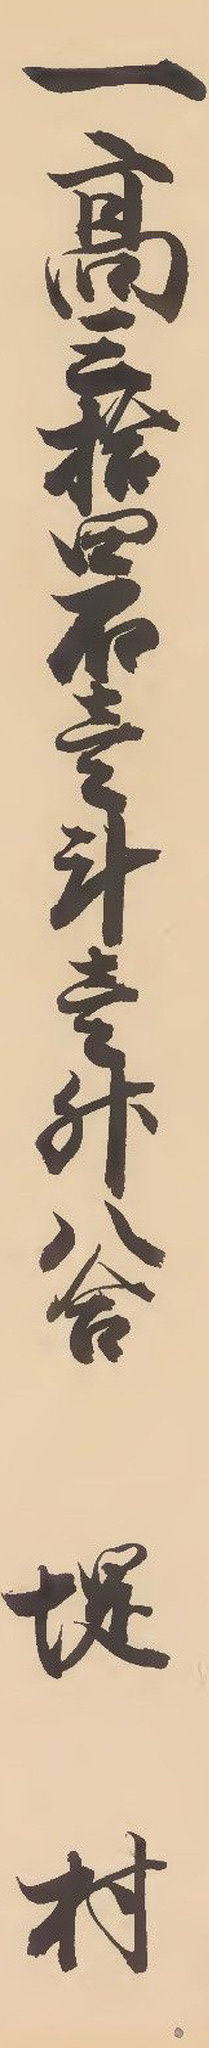一高三拾四石壱斗壱升八合堤村
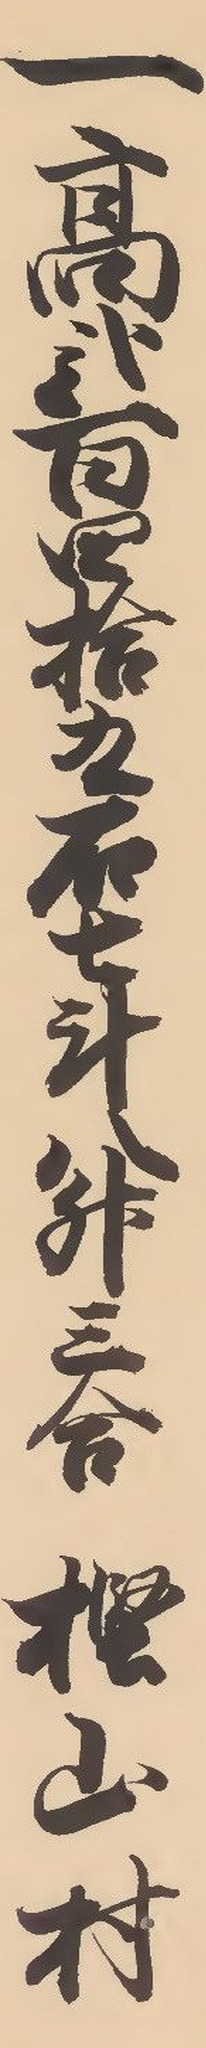一高弐百四拾九石七斗八升三合樫山村
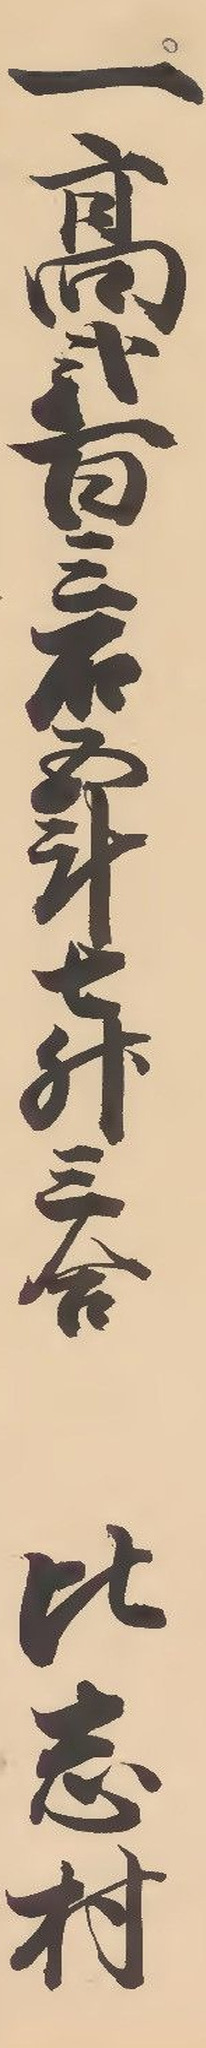一高弐百三石五斗七升三合比志村
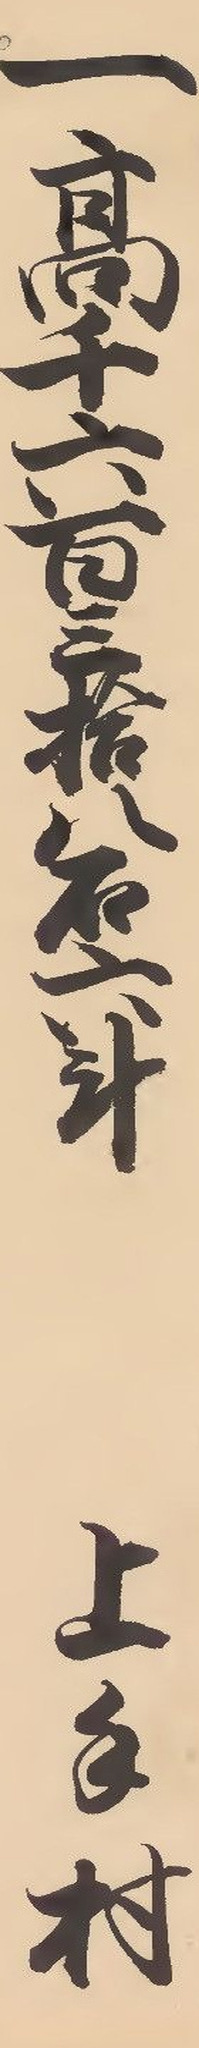一高千六百三拾八石六斗上手村
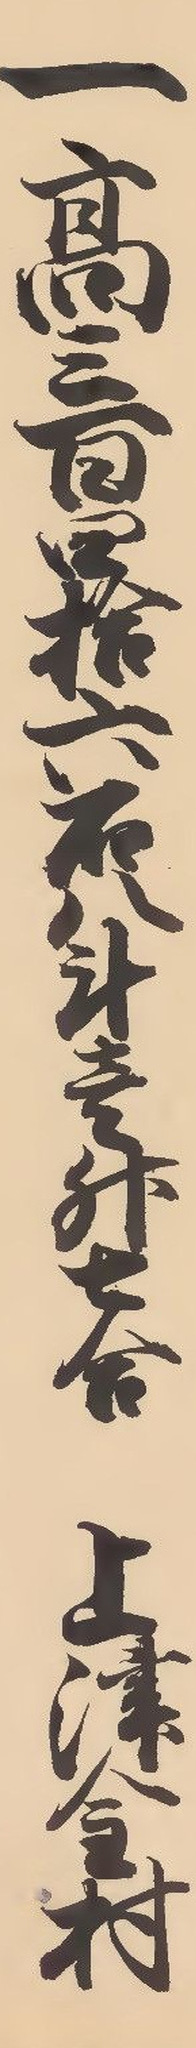一高三百四拾六石八斗壱升七合上津金村
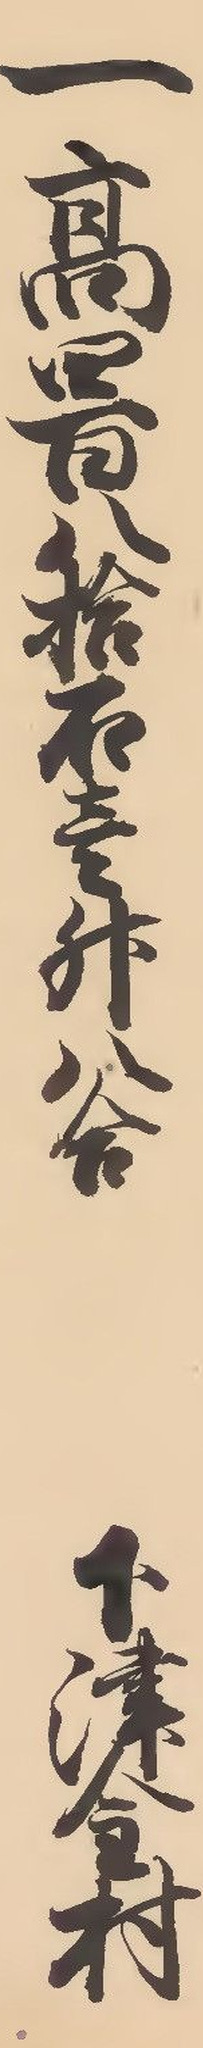一高四百八拾石壱升八合下津金村
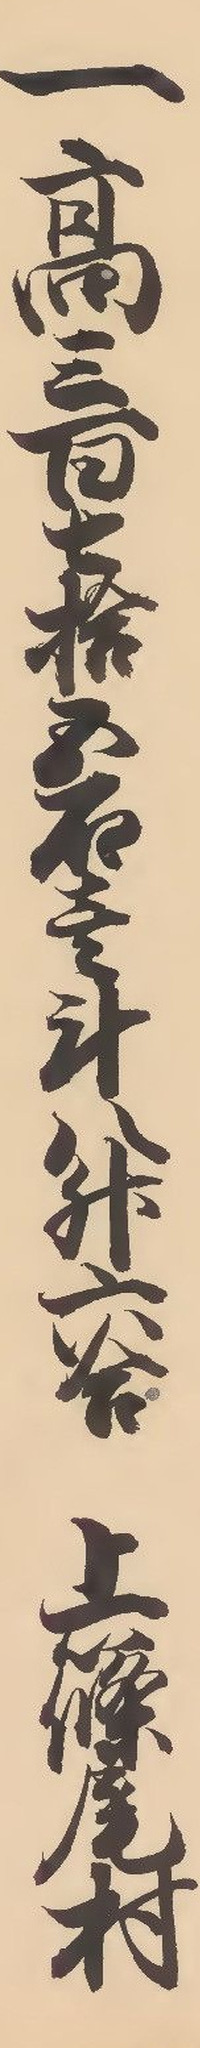一高三百七拾五石壱斗八升六合上条尾村

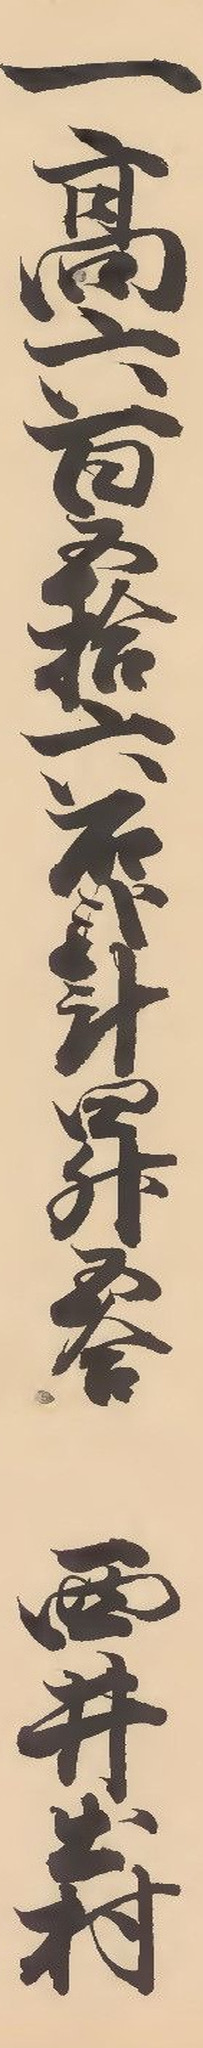一高六百五拾六石弐斗四升五合西井出村
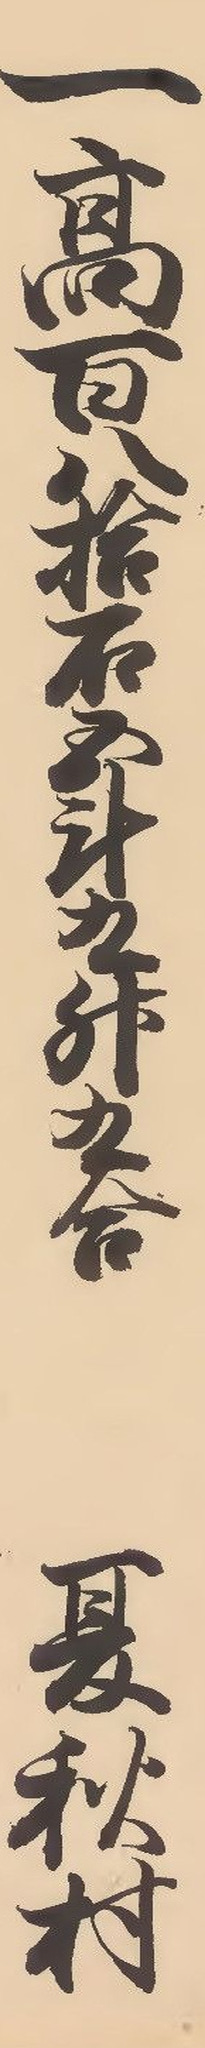一高百八拾石五斗九升九合夏秋村
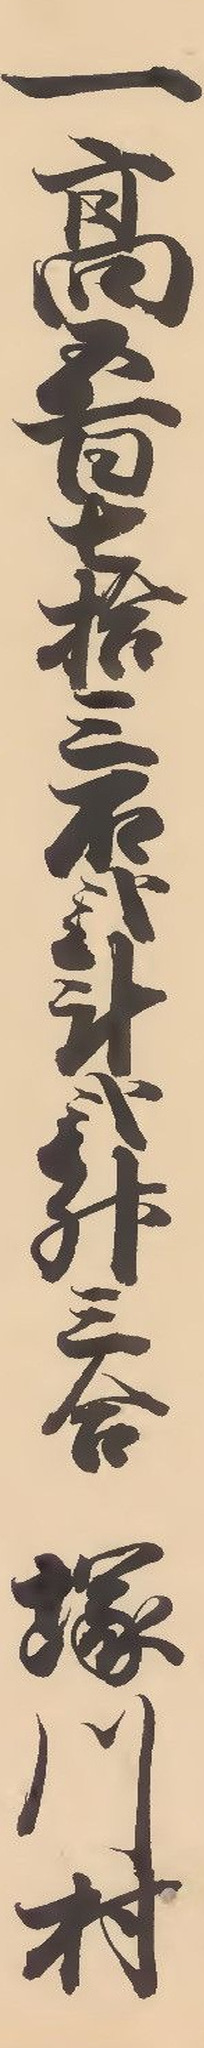一高五百七拾三石弐斗弐升三合塚川村
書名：甲斐国郷帳
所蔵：国立公文書館 National Archives of Japan
